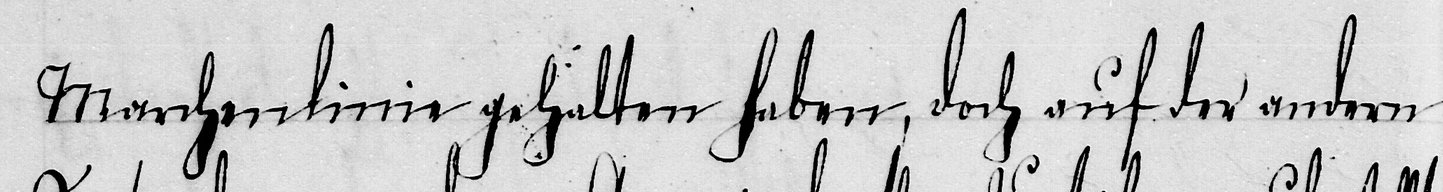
Marchenlinie gehalten haben, doch auf der andern
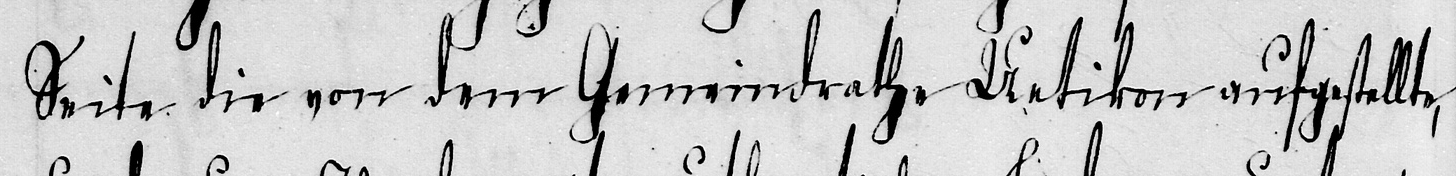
Seite die von dem Gemeindrathe Uetikon aufgestell¬
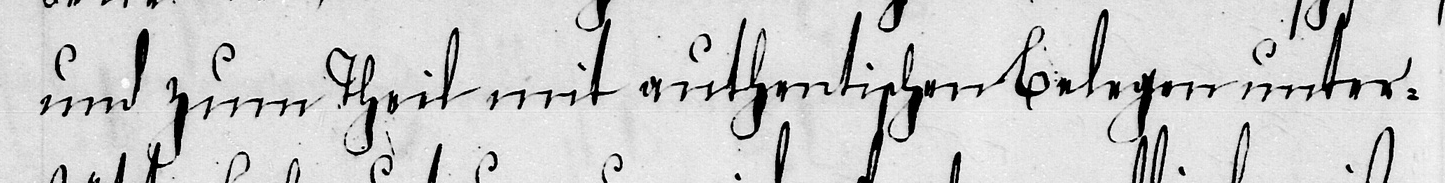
und zum Theil mit authentischen Belegen unter¬
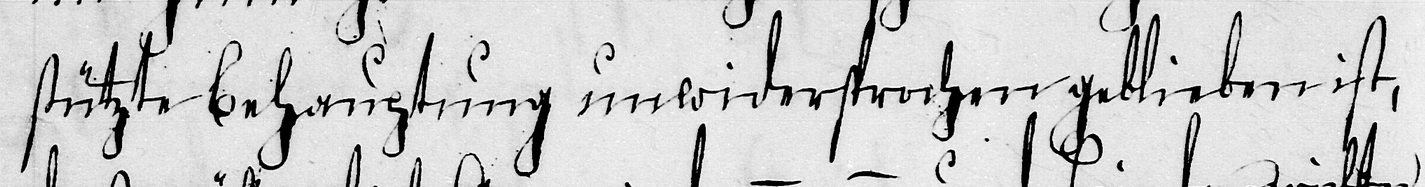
stützte Behauptung unwidersprochen geblieben ist,
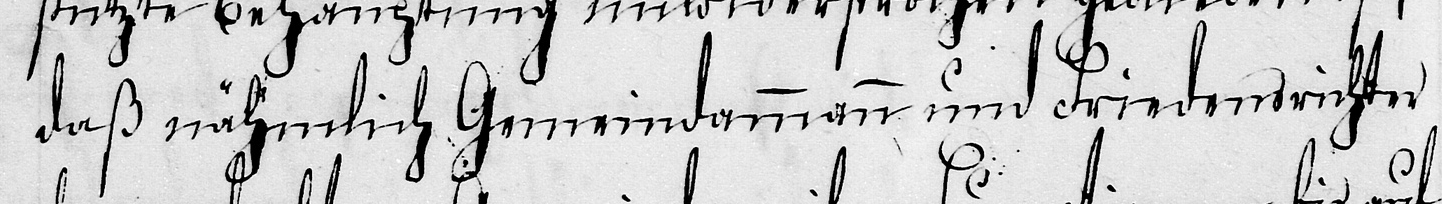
daß nämlich Gemeindammann und Friedensrichter
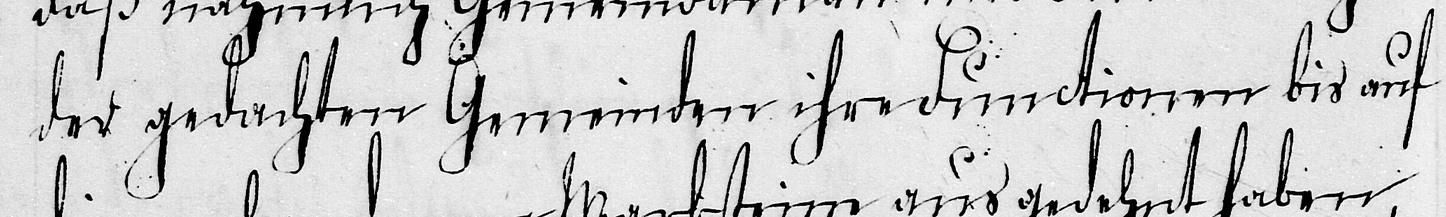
der gedachten Gemeinden ihre Functionen bis auf
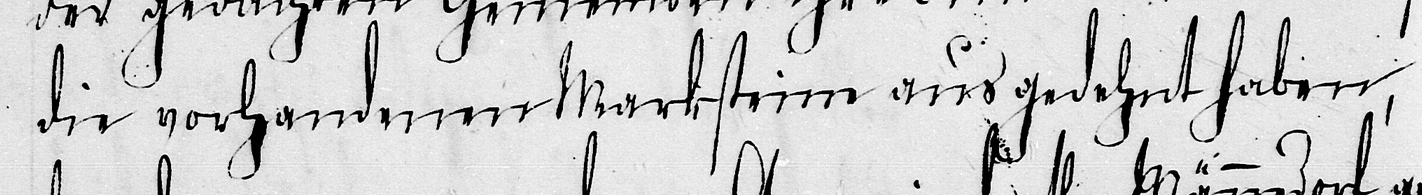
die vorhandenen Marksteine ausgedehnt haben,
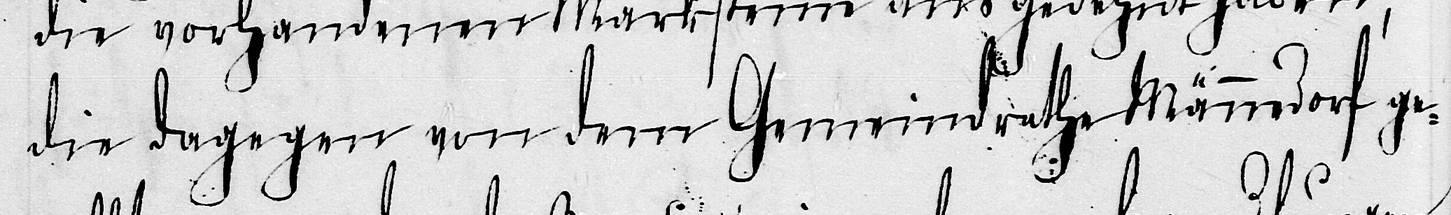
die dagegen von dem Gemeindrathe Männedorf g¬
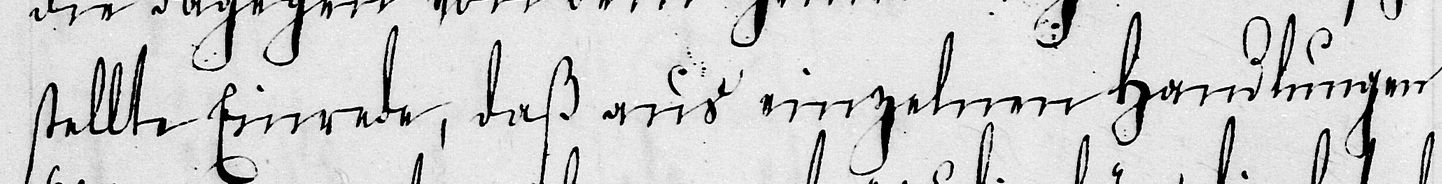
tellte Einrede, daß aus einzelnen Handlungen
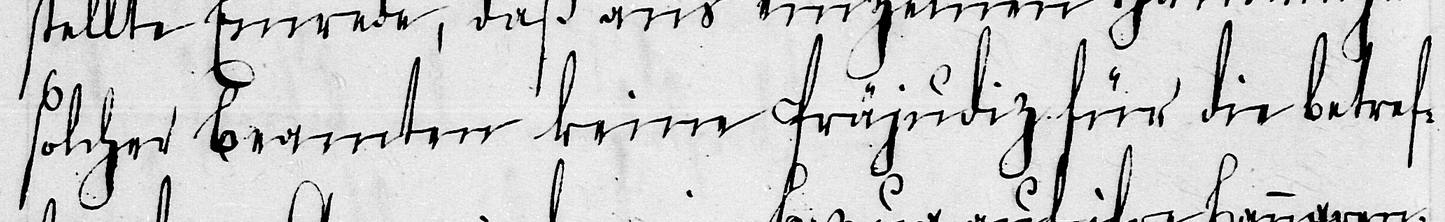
solcher Beamten keine Präjudiz für die betre¬
